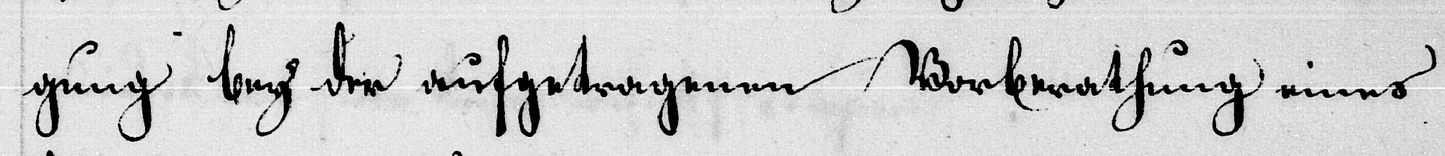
gung bey der aufgetragenen Vorberathung eines
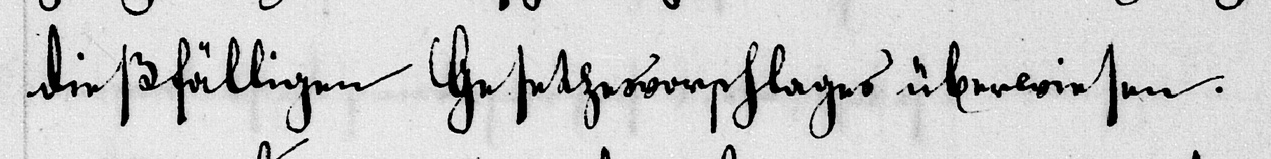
dießfälligen Gesetzesvorschlages überwiesen.
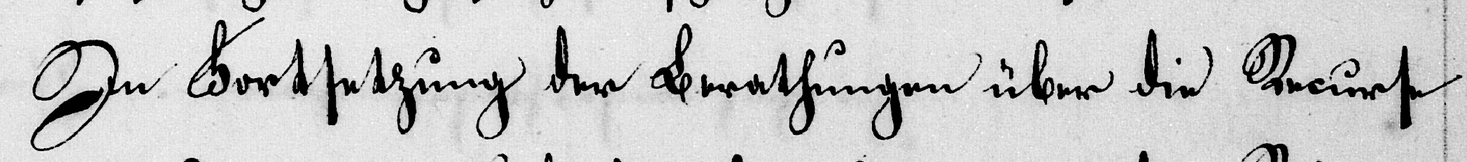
In Fortsetzung der Berathungen über die Recurse
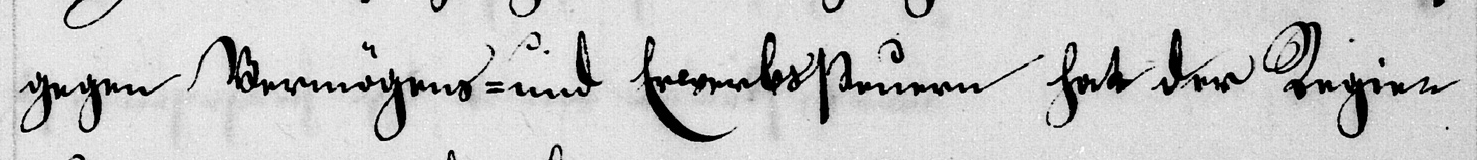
gegen Vermögens- und Erwerbssteuern hat der Regie¬
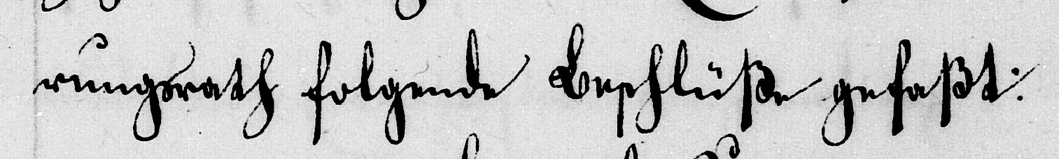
rungsrath folgende Beschlüße gefaßt:
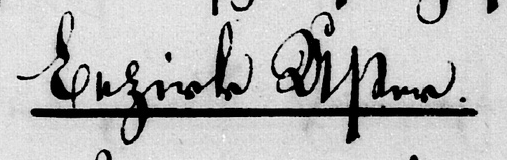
Bezirk Uster.
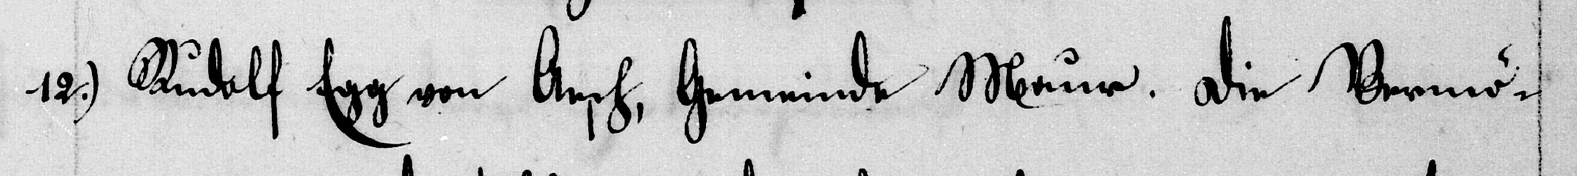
12.) Rudolf Egg von Aesch, Gemeinde Maur. Die Vermö¬
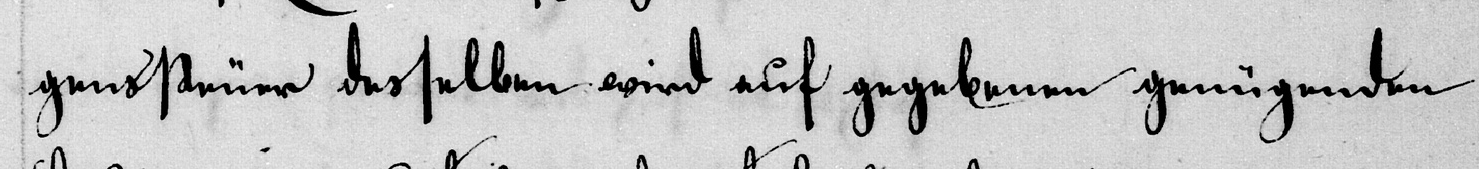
genssteuer desselben wird auf gegebenen genügenden
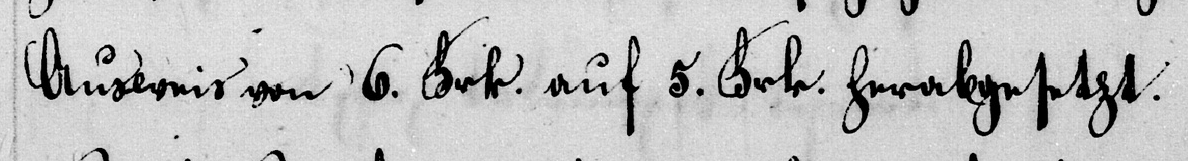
Ausweis von 6. Frk. auf 5. Frk. herabgesetzt.
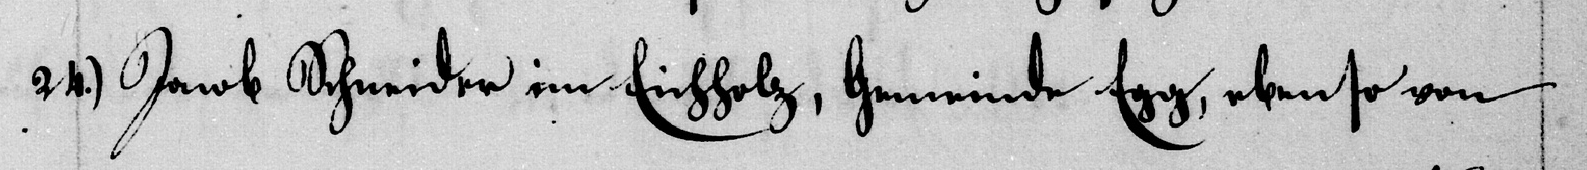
24.) Jacob Schneider in Eichholz, Gemeinde Egg, ebenso von
